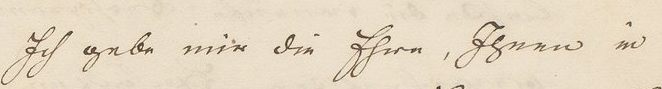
Ich gebe mir die Ehre, Ihnen in
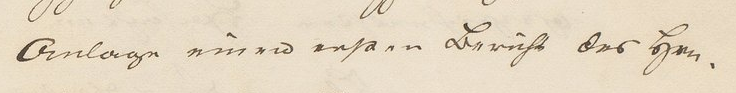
Anlage einen ersten Brief des Hrn.
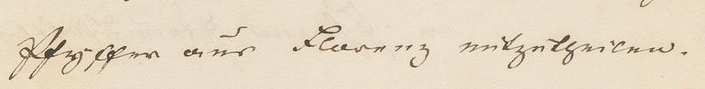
Pfyffer aus Florenz mitzutheilen.
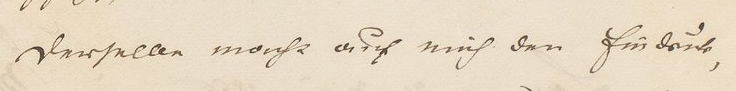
Derselbe macht auf mich den Eindruck,
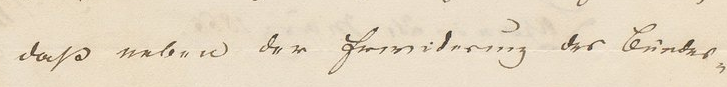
daß neben der Erwiderung des Bundes-
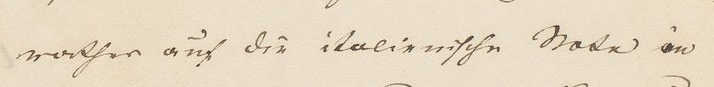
rathes auf die italienische Note in
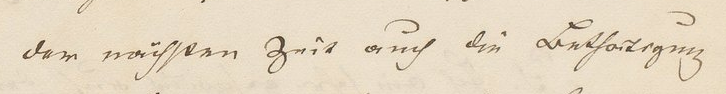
der nächsten Zeit auch die Bethätigung
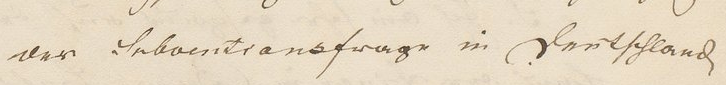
der Subventionsfrage in Deutschland
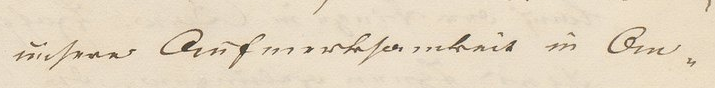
unsere Aufmerksamkeit in An-
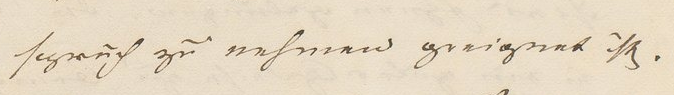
spruch zu nehmen geeignet ist.
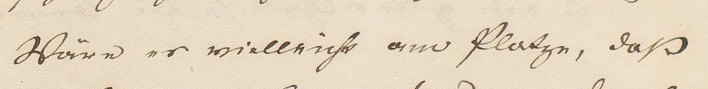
Wäre es vielleicht am Platze, daß
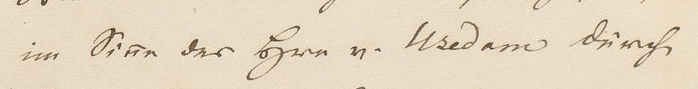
im Sinne des Hrn. v. Usedom durch
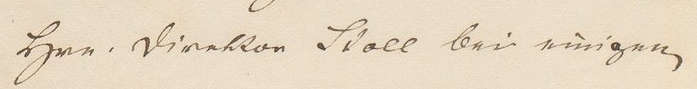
Hrn. Direktor Stoll bei einigen
